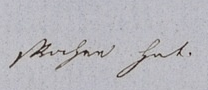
sprochen hat.
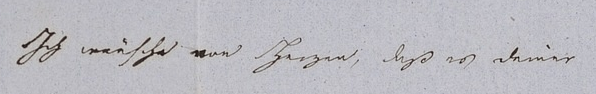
Ich wünsche von Herzen, daß es Deiner
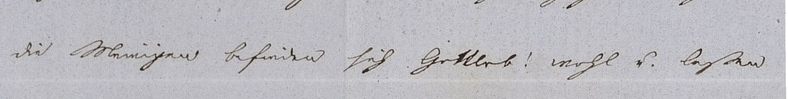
Die Meinigen befinden sich Gottlobe! wohl u. laßen
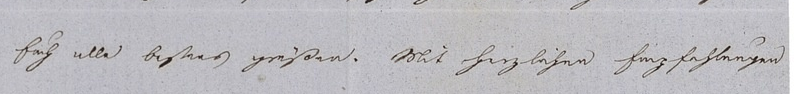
Euch alle bestens grüßen. Mit herzlichen Empfehlungen
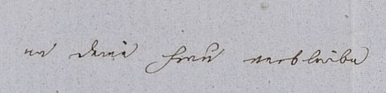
an Deine Frau verbleibe
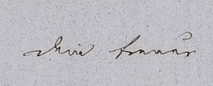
Dein treuer
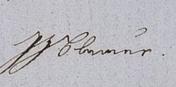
J J Blumer.
